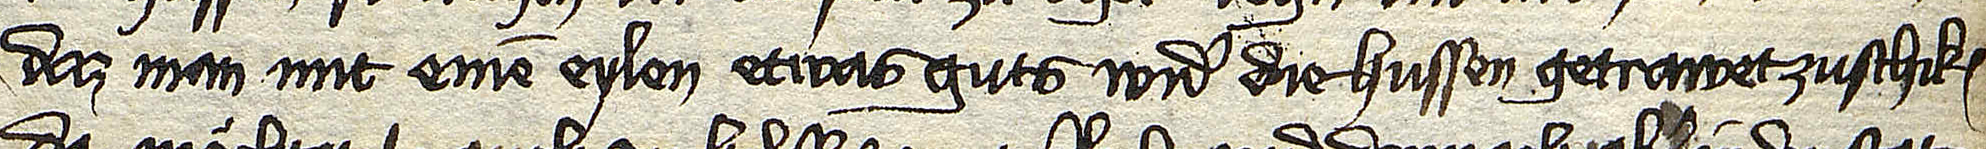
daʒ man mit eine* eylen etwas guts wid* die huſſen getrawet ʒuſchik*
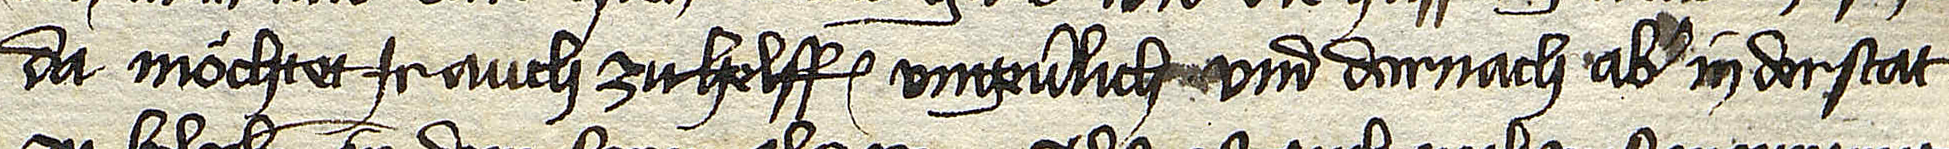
da möchtet Ir auch ʒu helff* vngeu*lich vnd darnach ab* in der ſtat
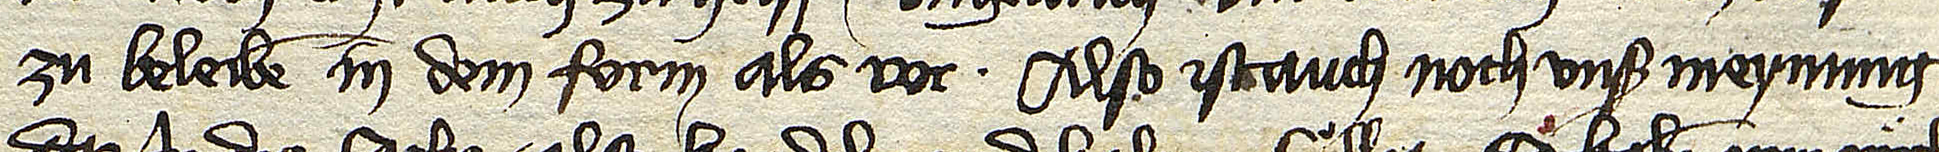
ʒu beleibe* in dem form als vor . Alſo iſt auch noch vnſ* meynung
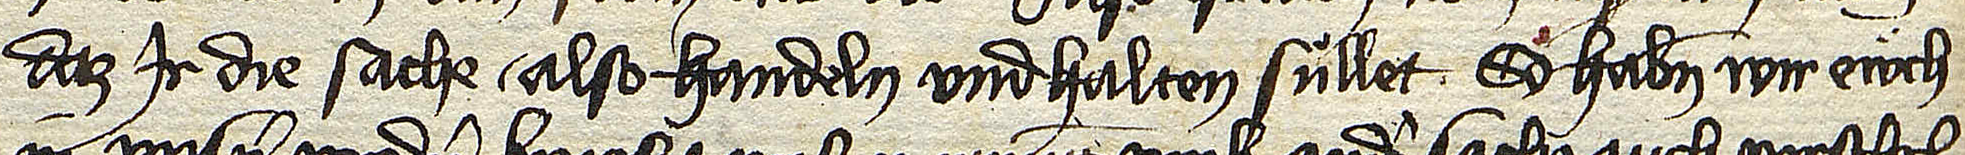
daʒ Ir die ſache / alſo handeln vnd halten ſüllet . So habn* wir ewch
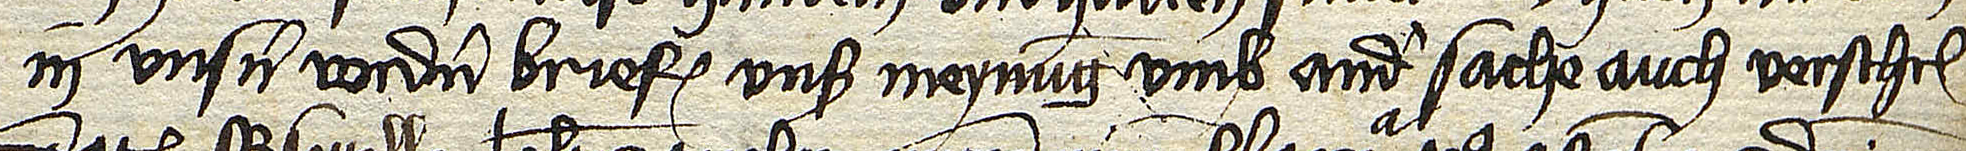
in vnſn* vordn* brief* vnſ* meynug* vmb and* ſache auch verſchr*
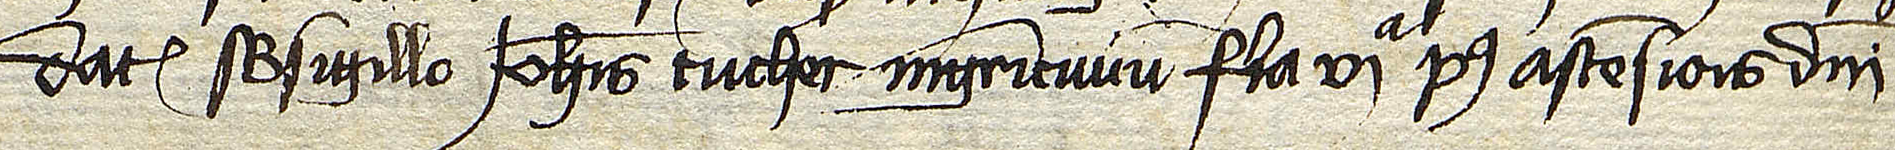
Dat* ſBſigillo Iohis* tucher mgri*ciuiu* fi*a vi* p* aſce*ſiois dni*
